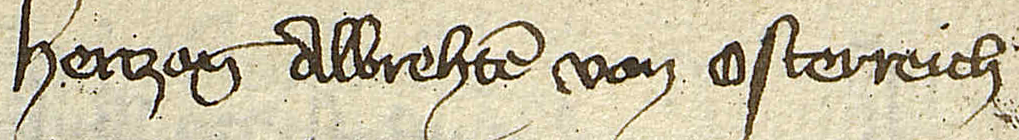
Hercʒog Albrehte* von Oſterreich
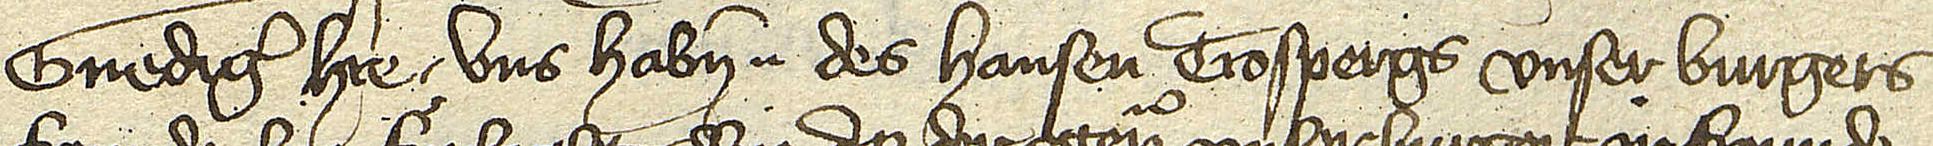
Gnedig* h*re / Vns habn* ~ des hanſen Troſpergs vnſer burgers
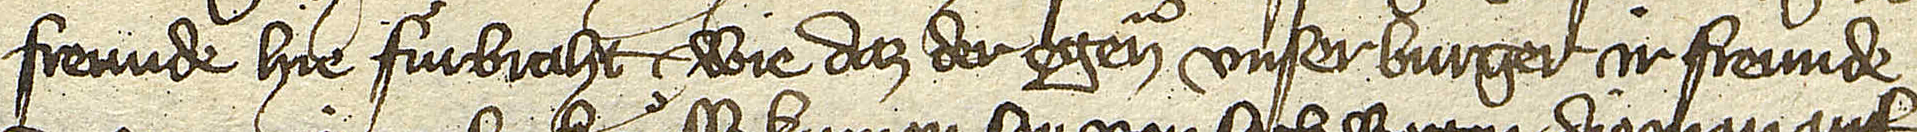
freunde hie fürbraht / wie daʒ der egen* vnſer burger ir freunde
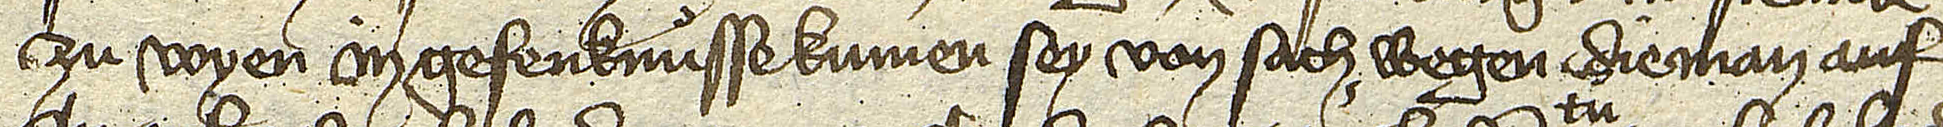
cʒu wyen in gefenknüſſe kumen ſey von ſach wegen / die man auf
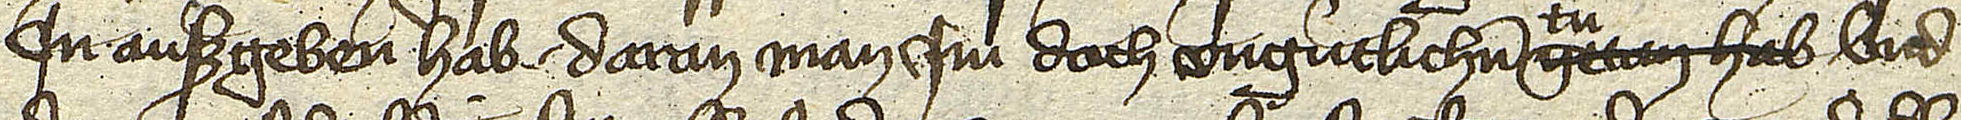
In auſʒgeben hab / daran man Im doch vngütlichn* getan hab vnd
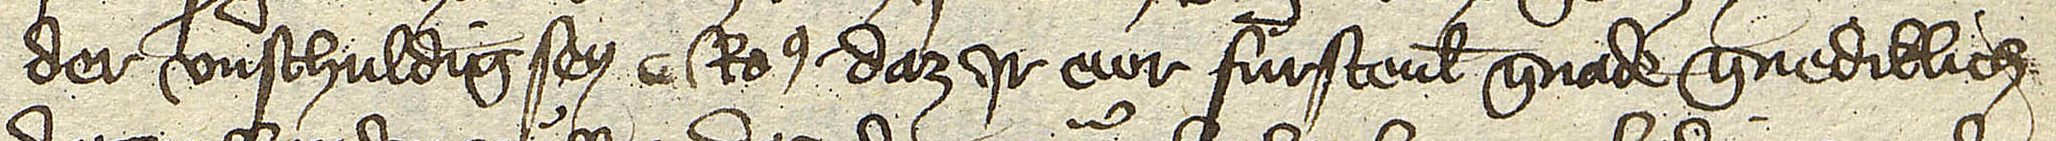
der vnſchuldig ſey / Ro* / daʒ Ir ewr fürſtenl* gnade gnediklich
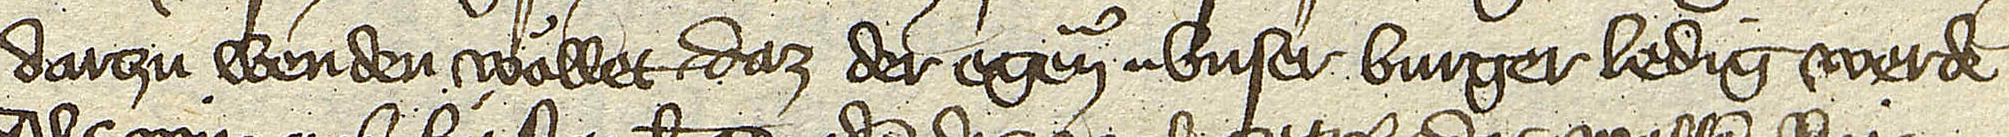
darcʒu wenden wöllet / daʒ der egen* ~ vnſer burger ledig werde
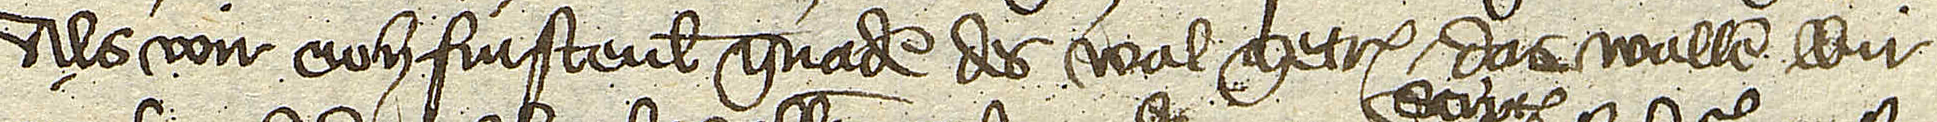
Als wir ewn* fürſtenl* gnad* des wol getr* / das wolle* wir
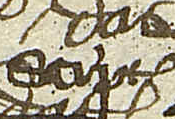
Scr*pt*
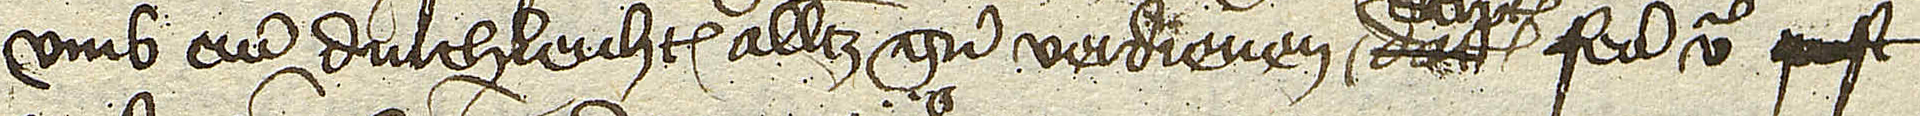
v̈mb ew* durchleuht* allcʒ* gn* verdienen / dat* fea* v* poſt
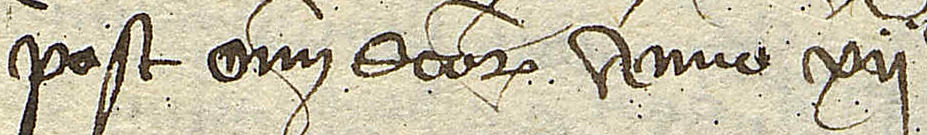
poſt Omi* Sco* Anno xii*
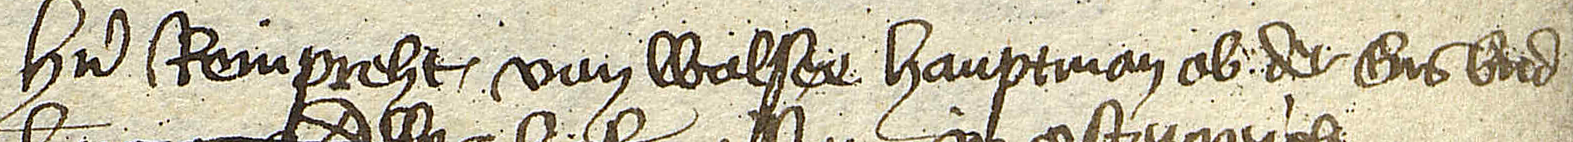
hn* Reinpreht* von wolſee hauptman ob der Ens vnd
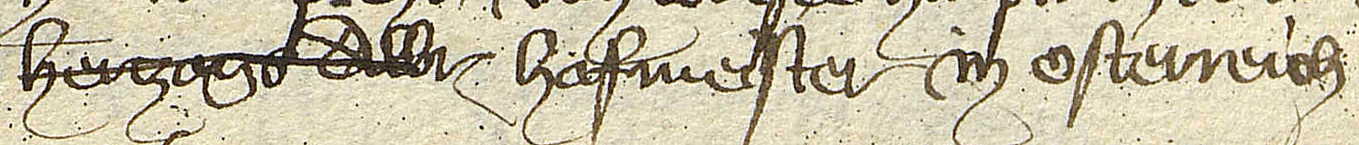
hercʒogs Albr* hofmeiſter in Oſterreich
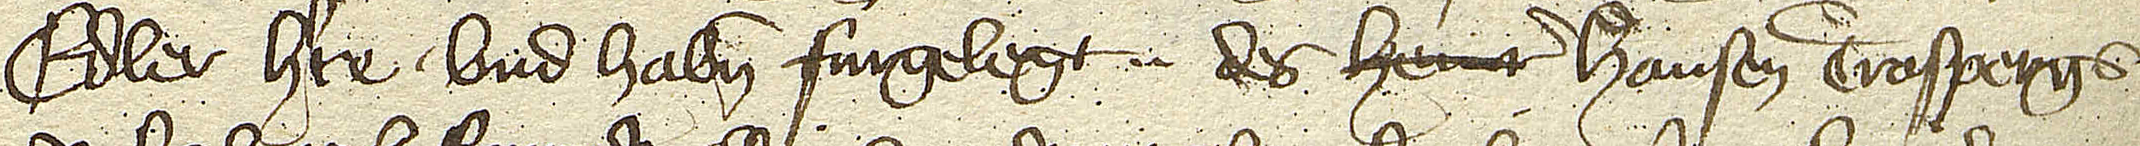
Edler h*re / vnd habn* fürgelegt ~ des heinr* hanſen Troſpergs
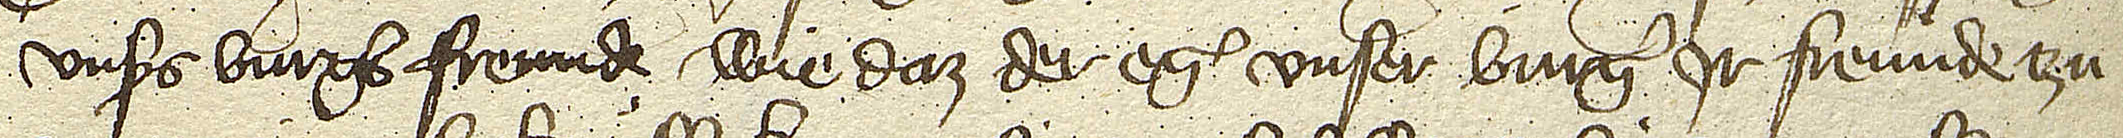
vnſ*s burg*s freunde / wie daʒ der eg* vnſer burg* Ir freunde cʒu
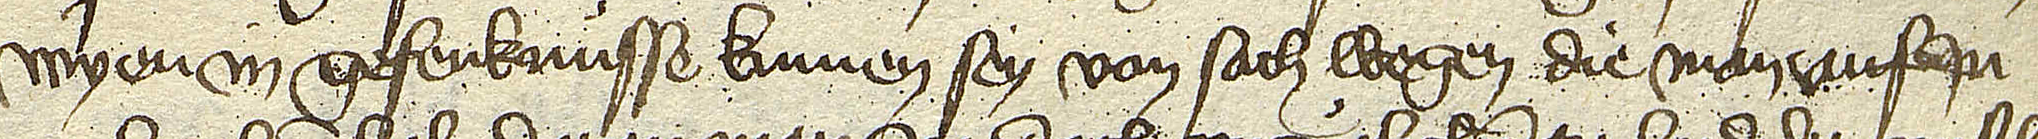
wyen in gefenknüſſe kumen ſey von ſach wegen die man auf In
